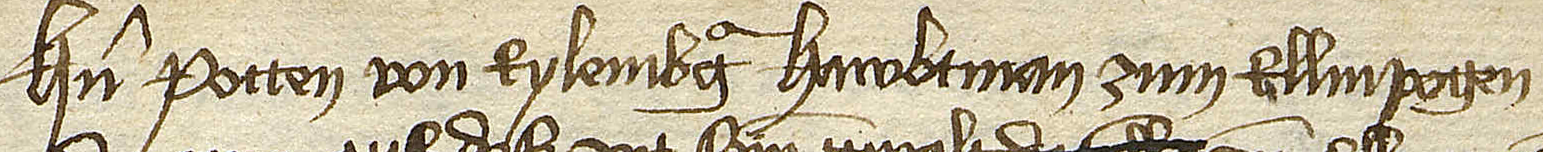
Hn* Potten von Eylemb*g Hawbtman ʒum Ellmpogen
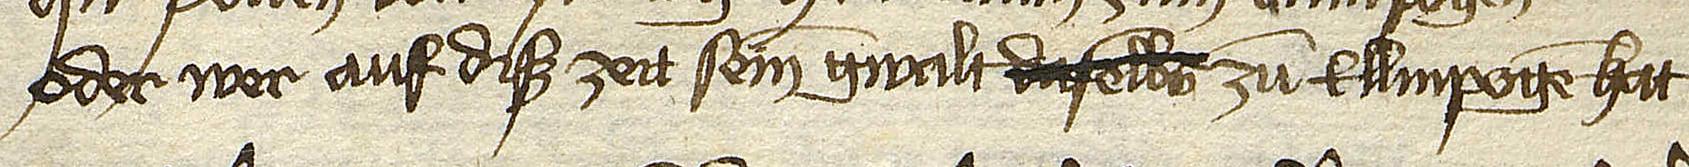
oder wer auf diſʒ ʒeit ſein* gwalt daſelbs ʒu* Ellmpoge* hat
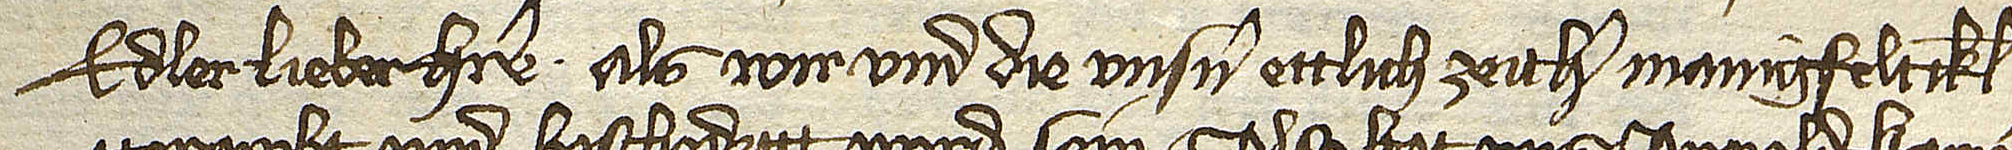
Edler lieber h*re . als wir vnd die vnſn* ettlich ʒeith* manigfeltikl*
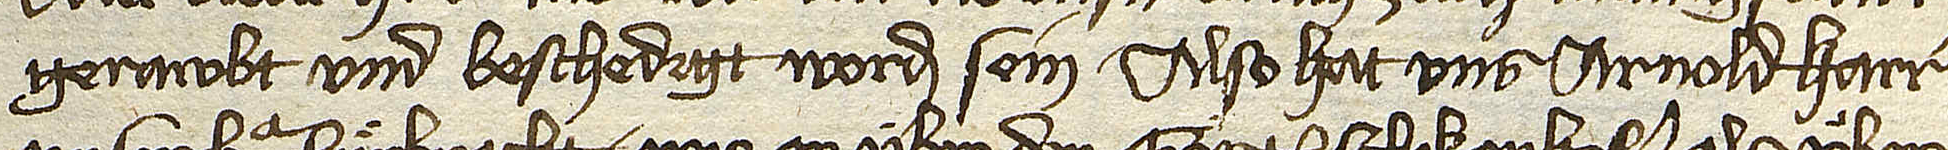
gerawbt vnd beſchedigt word* ſein / Alſo hat vns Arnold Harr*
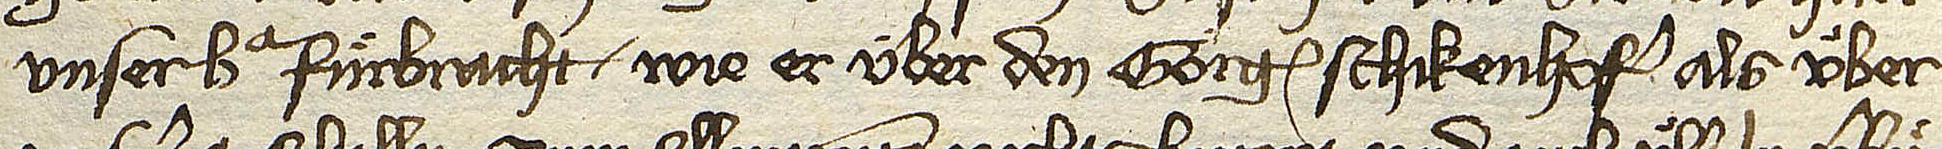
vnſer b* fürbracht / wie er v̈ber den Görg* ſchikenhof* als v̈ber
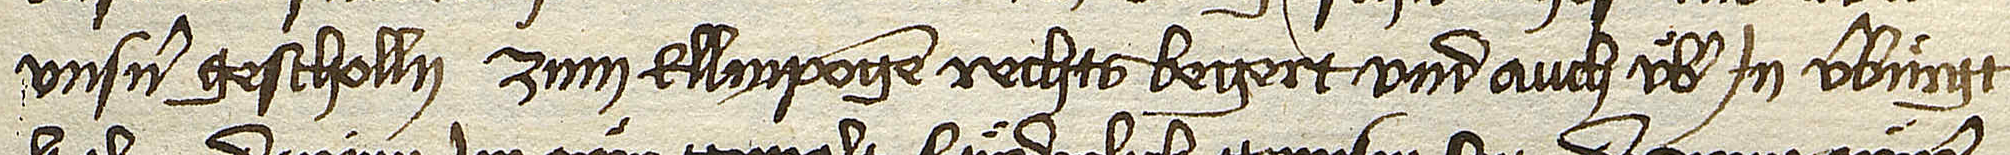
vnſn* geſcholln ʒum Ellmpoge* rechts begert vnd auch v̈b* In v*bürgt
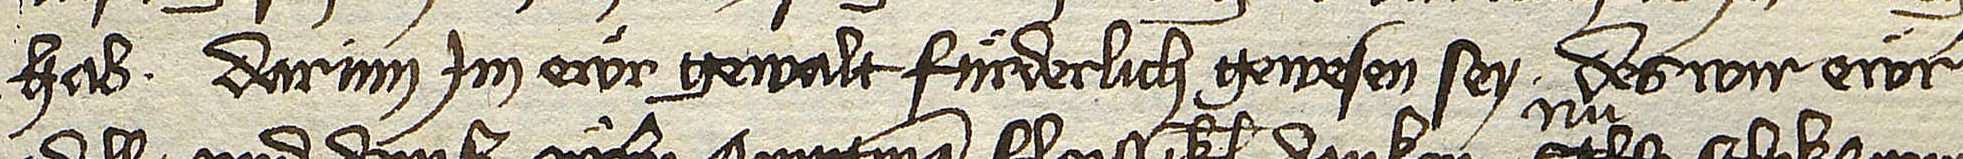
hab . Darinn Im eẅr gewalt fürderlich geweſen ſey . Des wir eẅr*
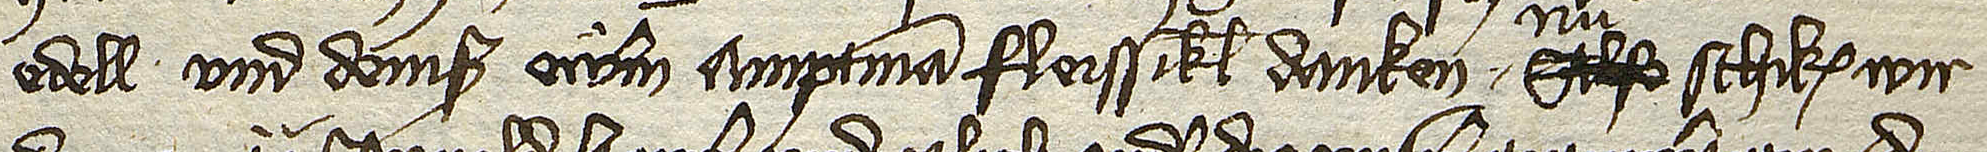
edell . vnd demſ* eẅ*m Amptma* fleiſſikl* danken / Alſo ſchik* wir
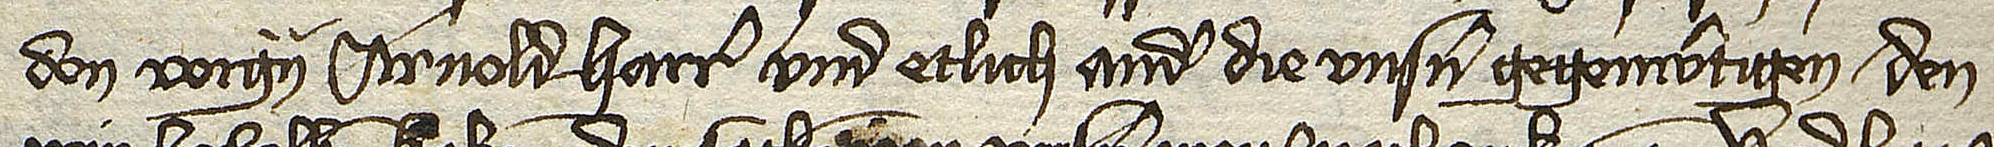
den vorgn* Arnold* harr* vnd etlich and* die vnſn* gegenw*tigen / den
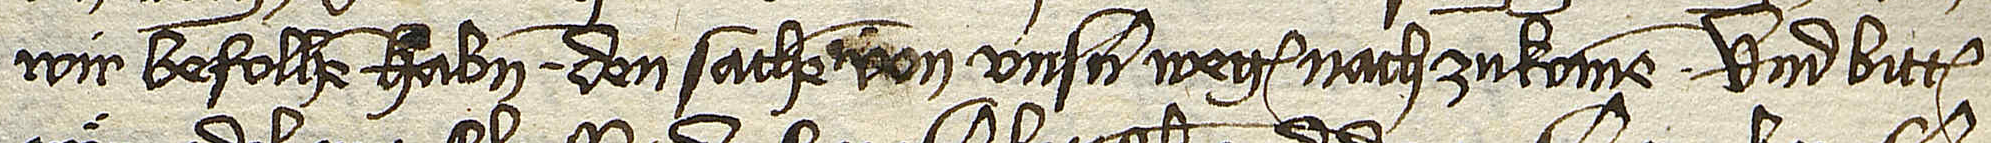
wir befolhe* habn* . den ſache* von vnſn* weg* nach ʒu kome* . Vnd bitt*
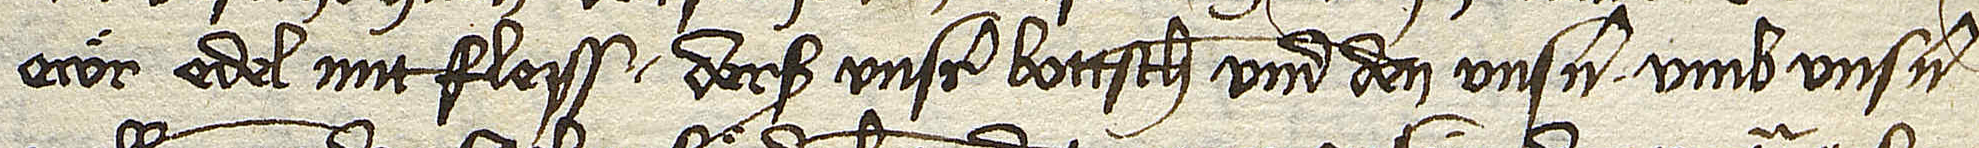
eẅr edel mit fleiſſ / derſ* vnſr* bottſch* vnd den vnſn* / vmb vnſn*
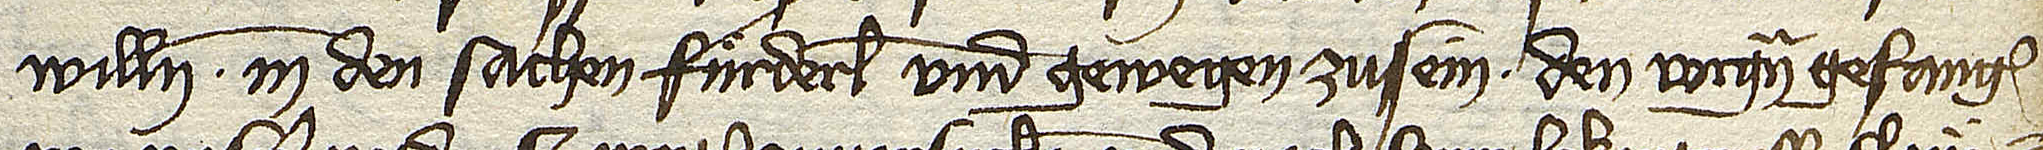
willn* . in den ſachen fürderl* vnd gewegen ʒuſein . den vorgn* gefang*
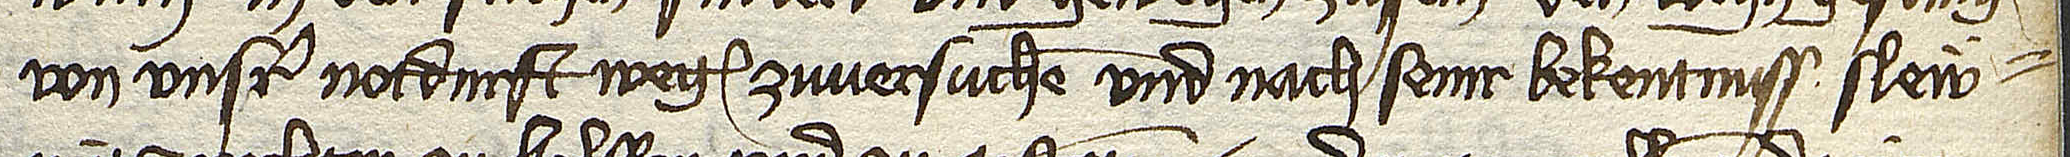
von vnſr* notdurft weg* ʒuuerſuche* vnd nach ſeinr bekentnuſſ . ſleẅ =
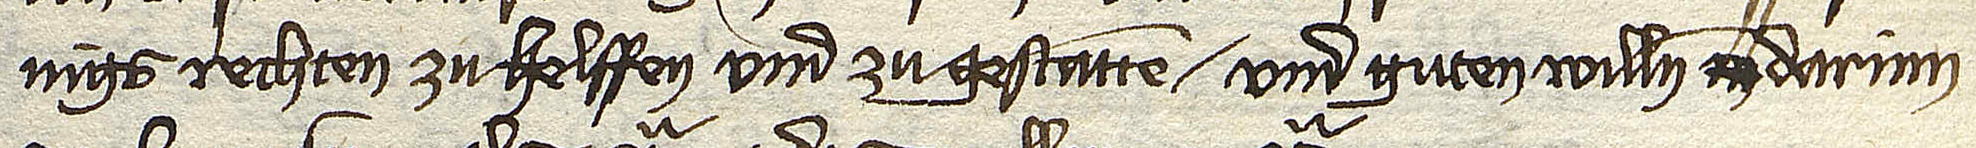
nigs rechten ʒu helffen vnd ʒu geſtatte* / vnd guten willn* in darinn
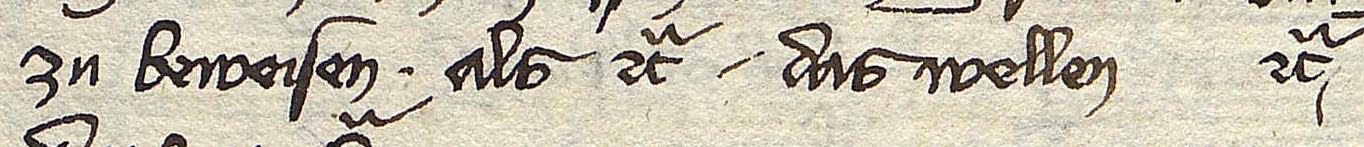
ʒu beweiſen . als ec* / das wellen ec*
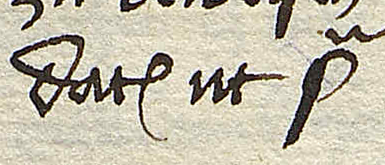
Dat* ut ſ*
